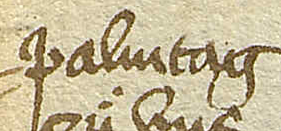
palmtag
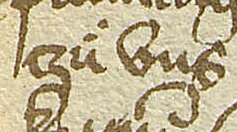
cʒü vns
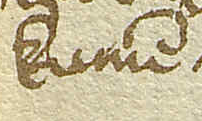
kume*
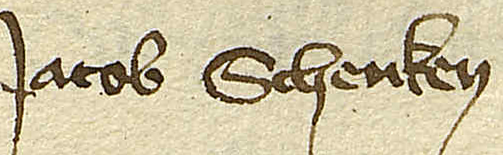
Iacob Schenken
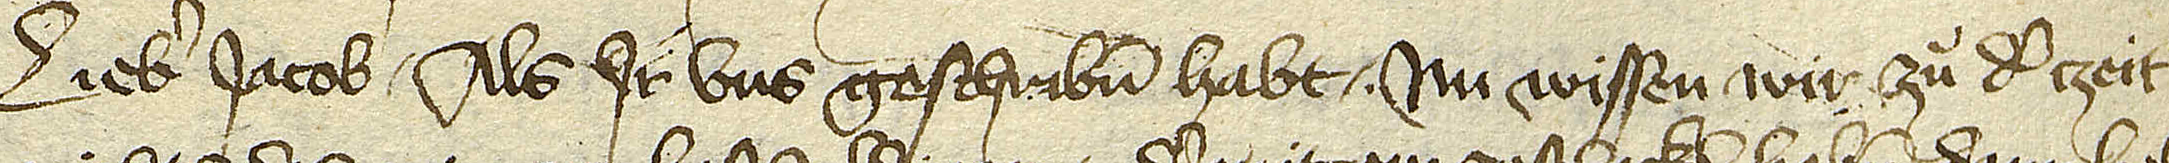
Lieb* Iacob / Als Ir vns geſchribn* habt / . Nu wiſſen wir cʒü d* cʒeit
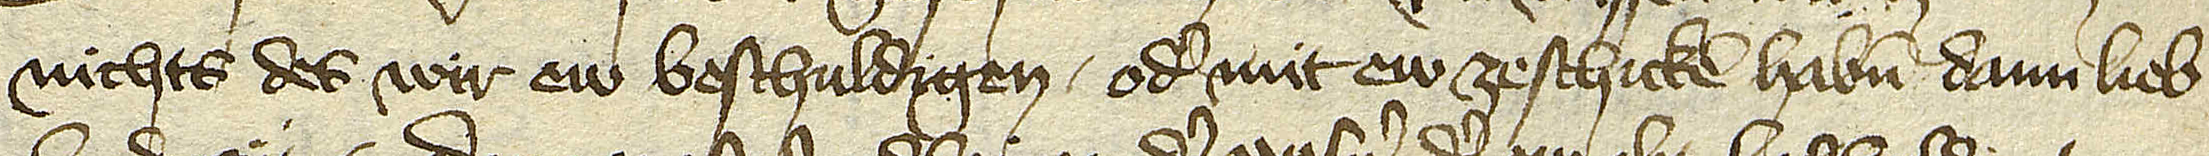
nichts des wir ew beſchuldigen / od* mit ew cʒeſchicke habn* dann lieb
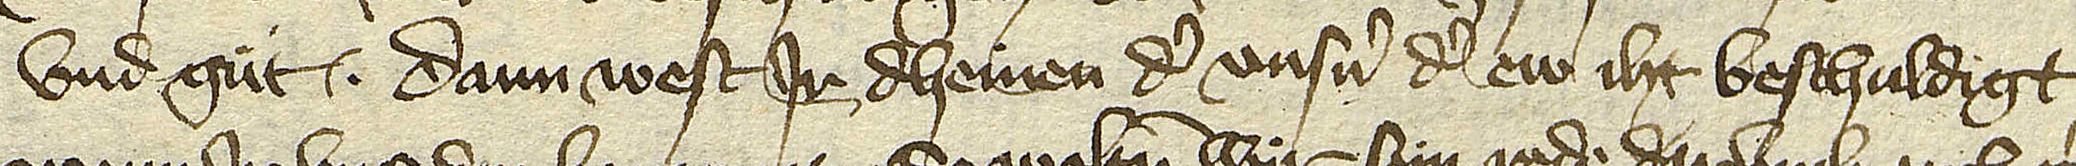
vnd güt /. Dann weſt Ir dheinen d* vnſn* d* ew iht beſchuldigt
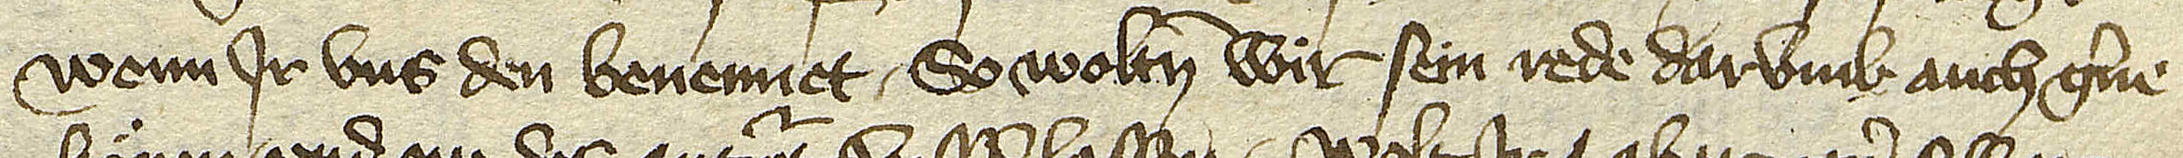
wenn Ir vns den benennet / So woltn* wir ſein rede darvmb auch g*ne
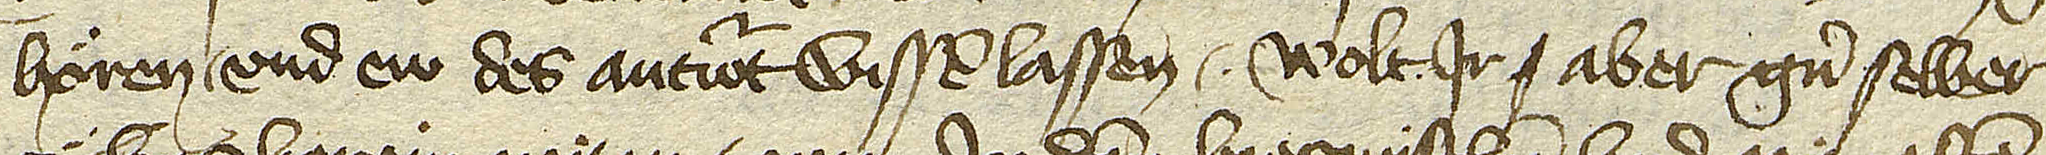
hören / vnd ew des antwt* wiſſe* laſſen / . wolt Ir / aber gn* ſelber
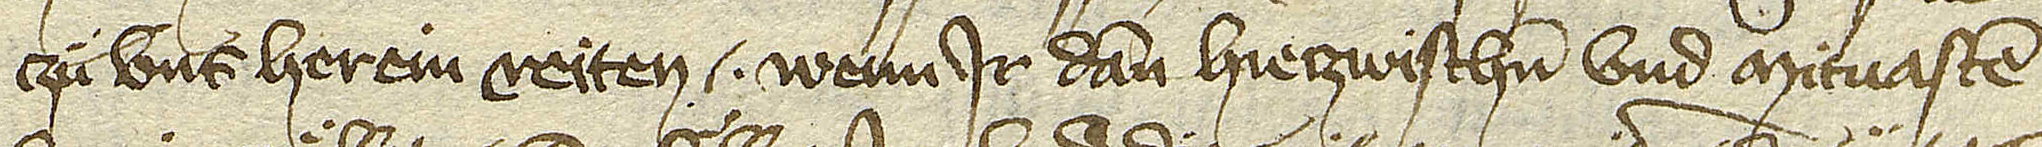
cʒü vns herein reiten / . wenn Ir dan* hiecʒwiſchn* vnd Mituaſte*
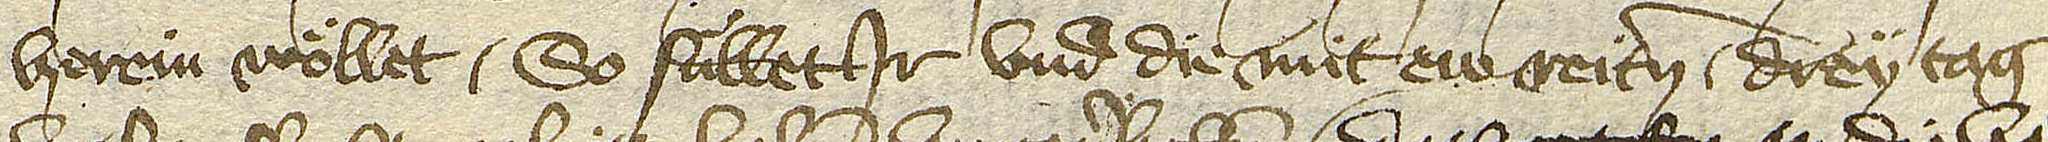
herein wöllet / So ſüllet Ir vnd die mit ew reitn* / drey tag
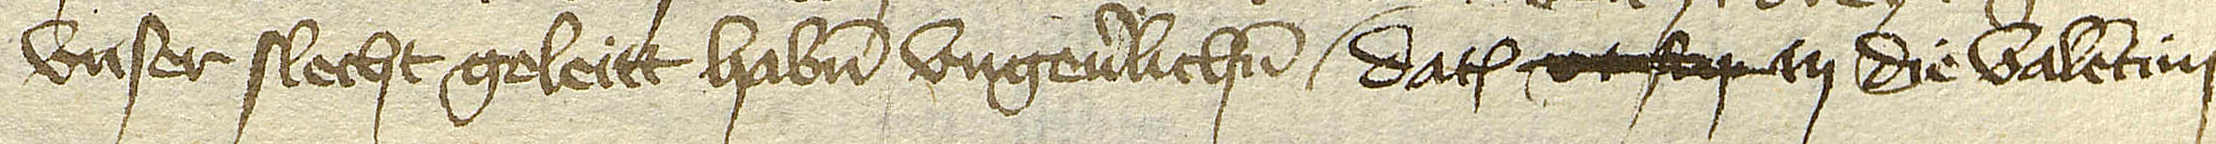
vnſer ſlecht geleitt habn* vngeu*lichn* / dat* vt ſup in die Vale*tini
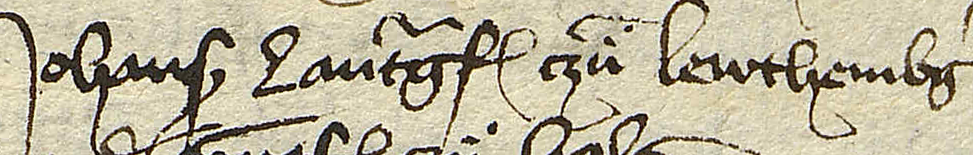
Iohanſ* lantg*f* cʒü lewthembg*
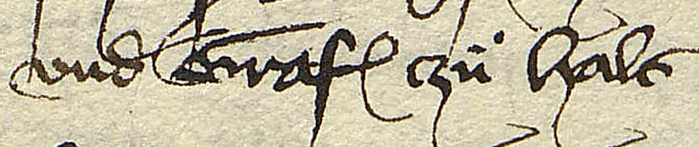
vnd Graf* cʒü hals
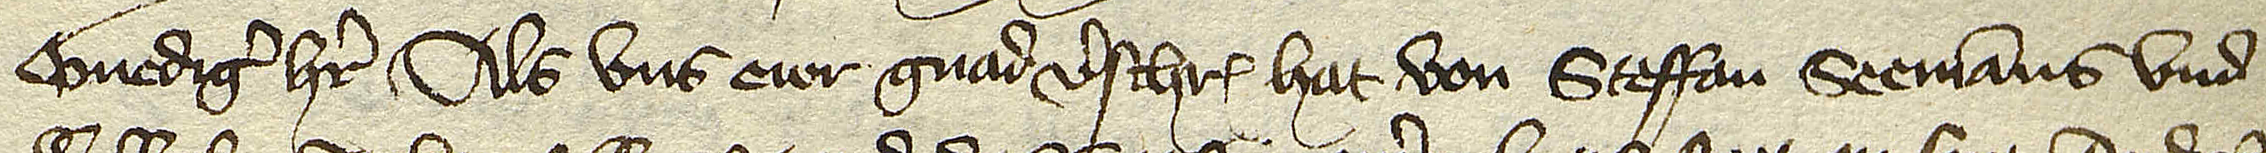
Gnedig* hr* / Als vns ewr gnad v*ſchr* hat von Steffan Seema*ns vnd
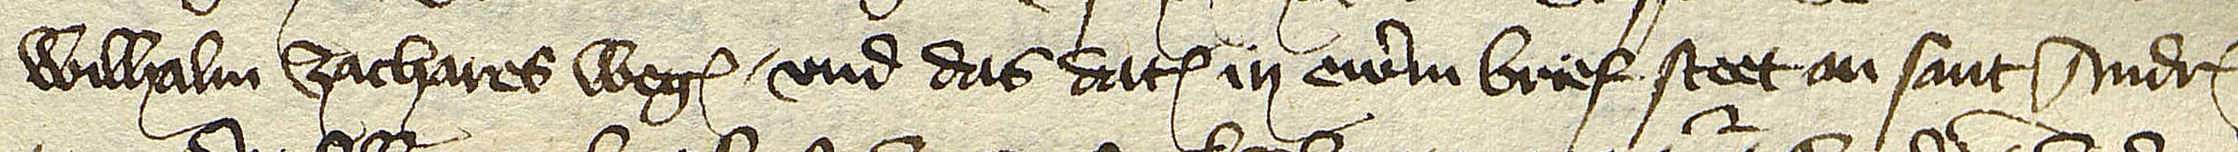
wilhalm cʒachares weg* / vnd das dat* in ew*m brief ſteet an ſant Andr*
